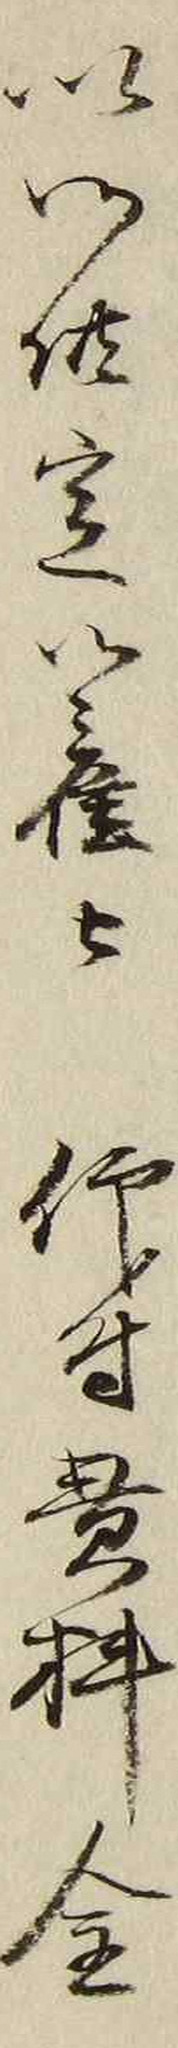以御供定御雇被仰付費料金
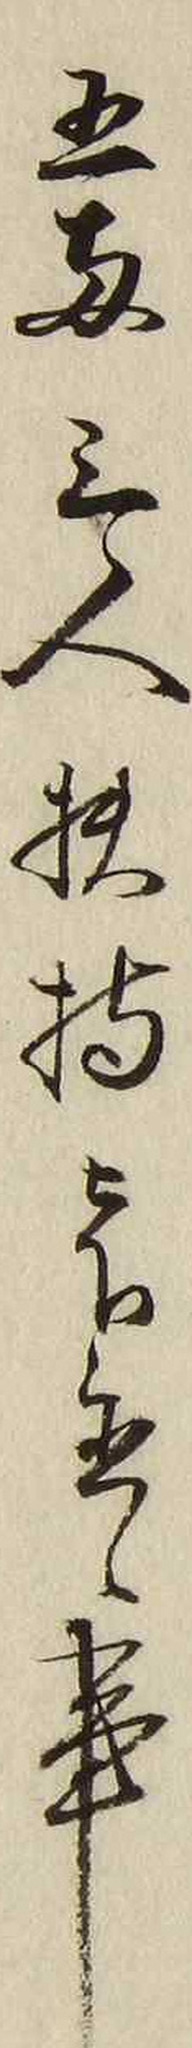五両三人扶持被下置候事

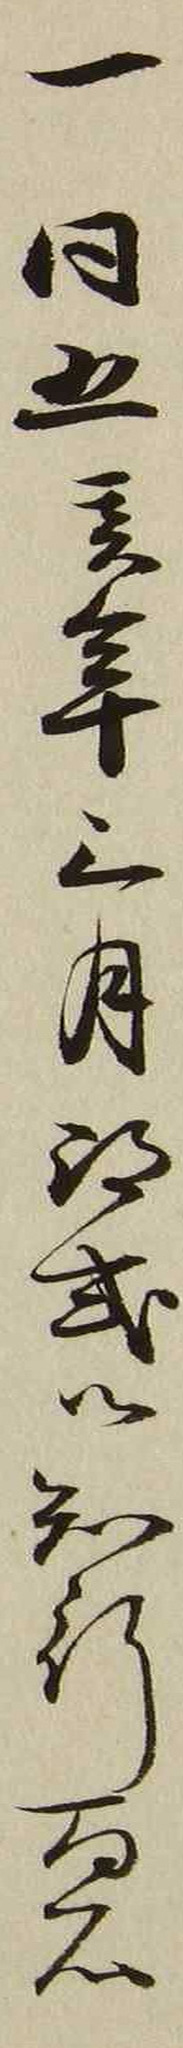一同五亥年三月跡式御知行百石
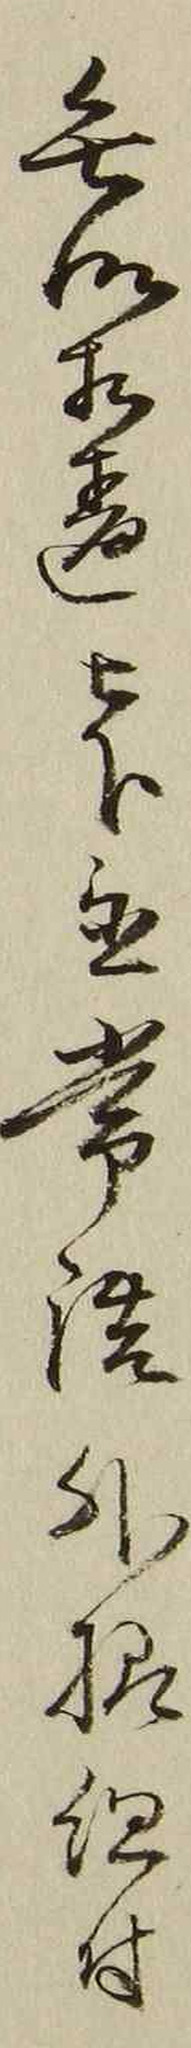無御相違被下置常詰外様組付
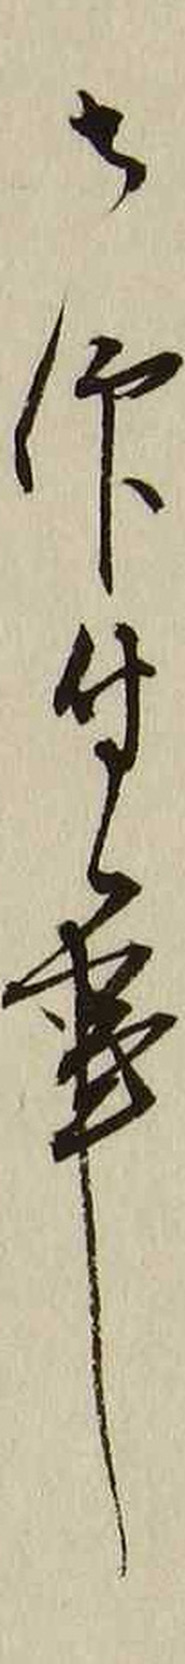被仰付候事
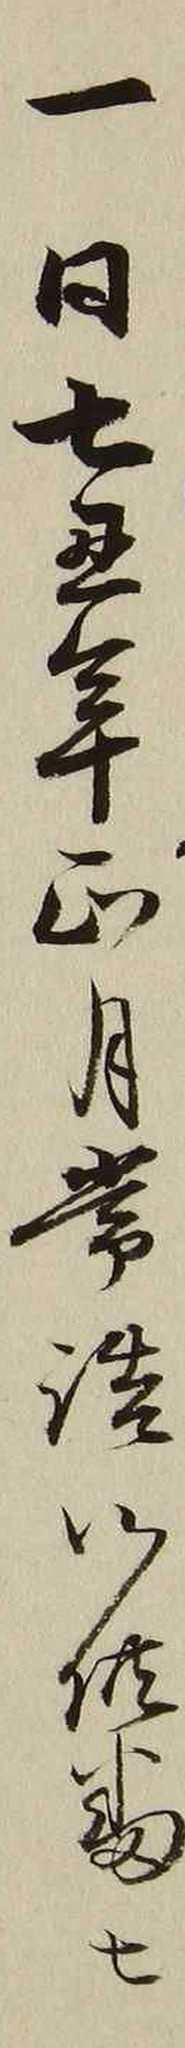一同七丑年正月常詰御供番被
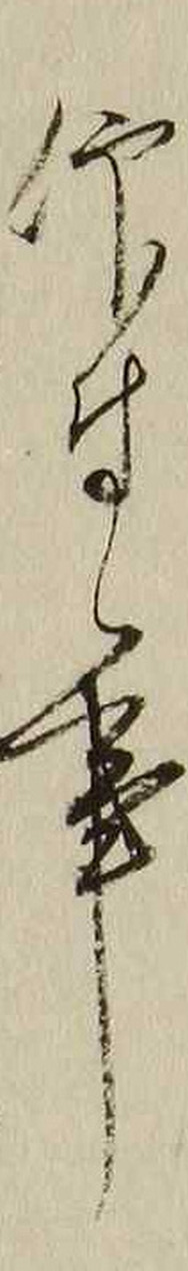仰付候事
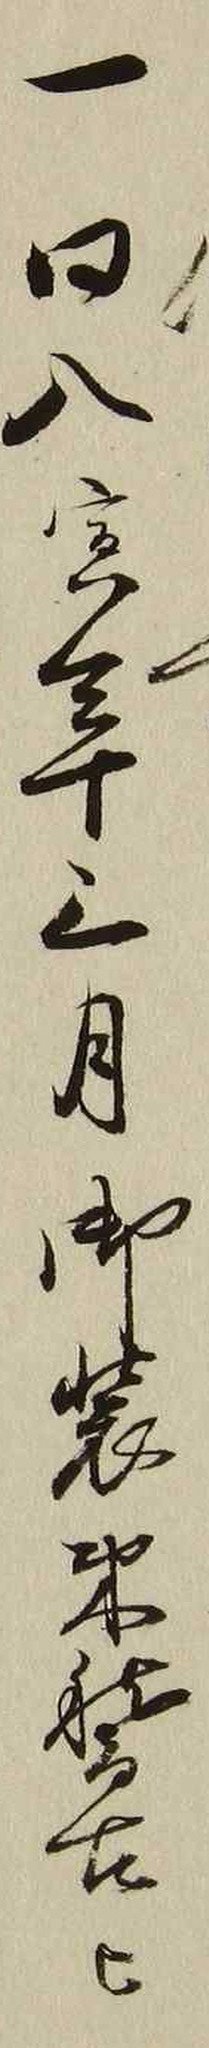一同八寅年三月御装束稽古被
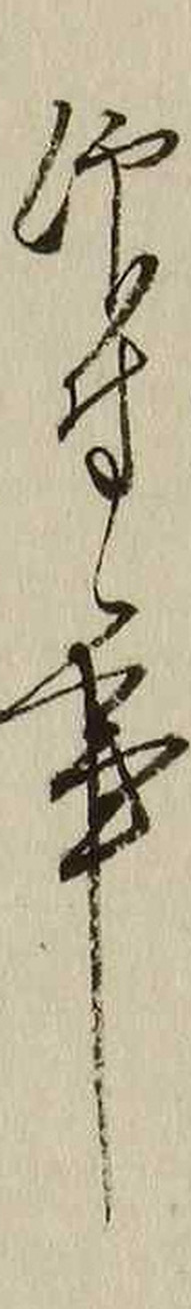仰付候事
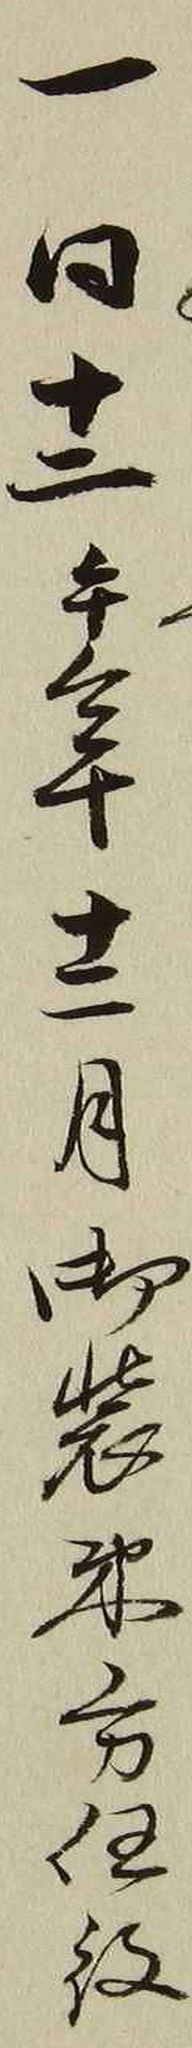一同十二午年十二月御装束方任役
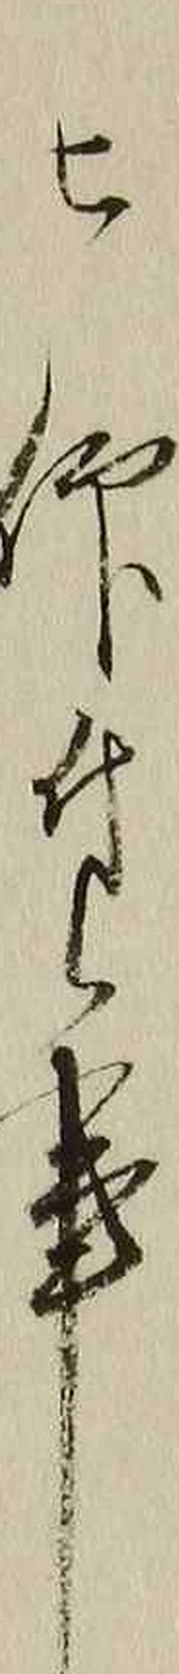被仰付候事
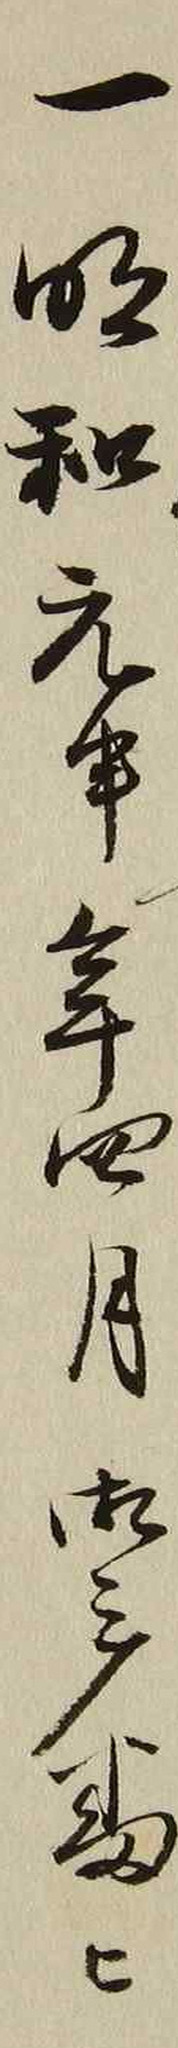一明和元申年四月御戸番被
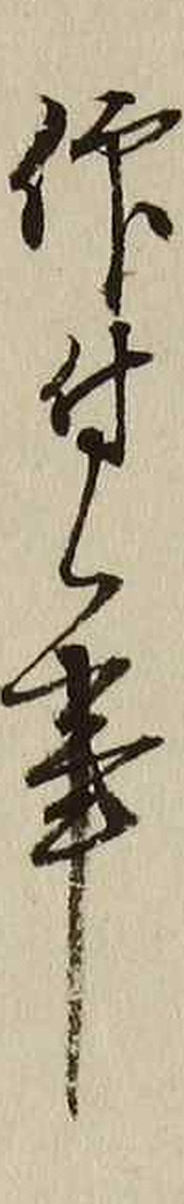仰付候事
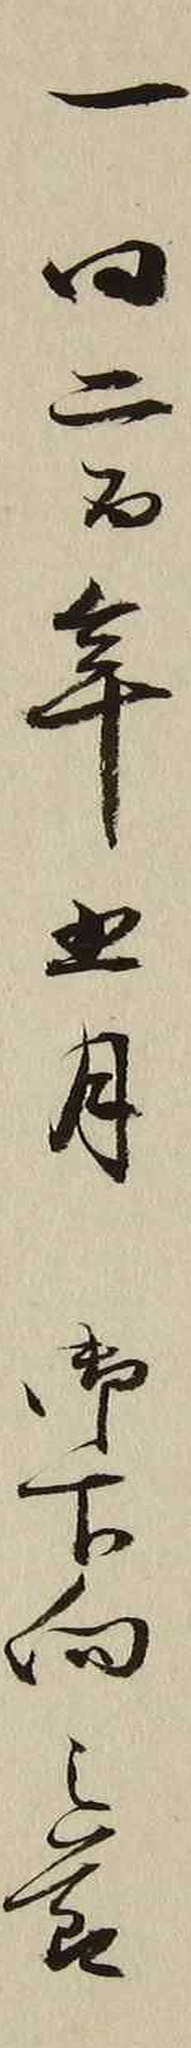一同二酉年五月御下向之節
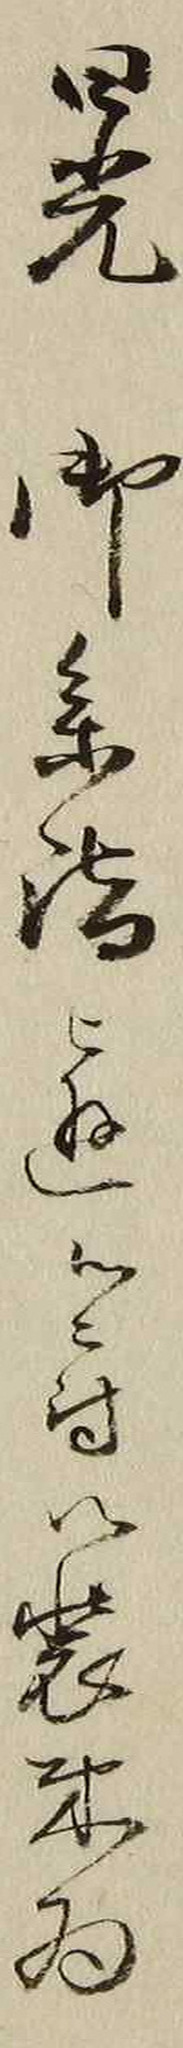日光御参詣被遊候に付御装束為
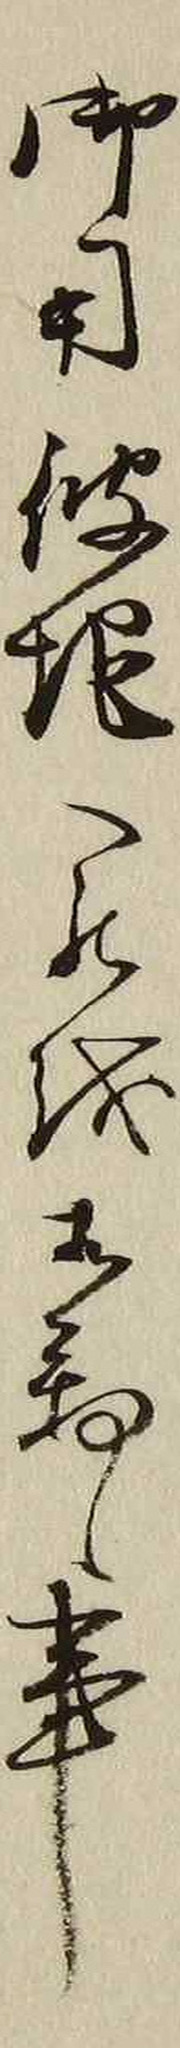御用彼地へ罷越相勤候事
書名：諸士系譜　巻之292　き之部1
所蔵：会津若松市立会津図書館
